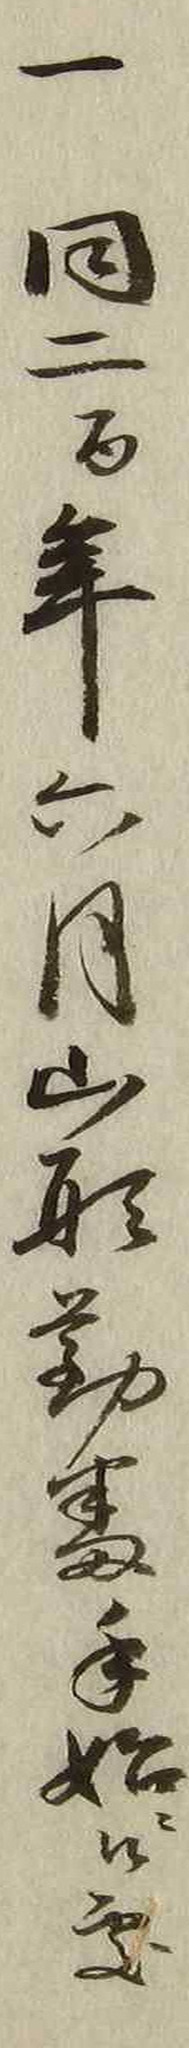一同二酉年六月山形勤番手始ニ候処
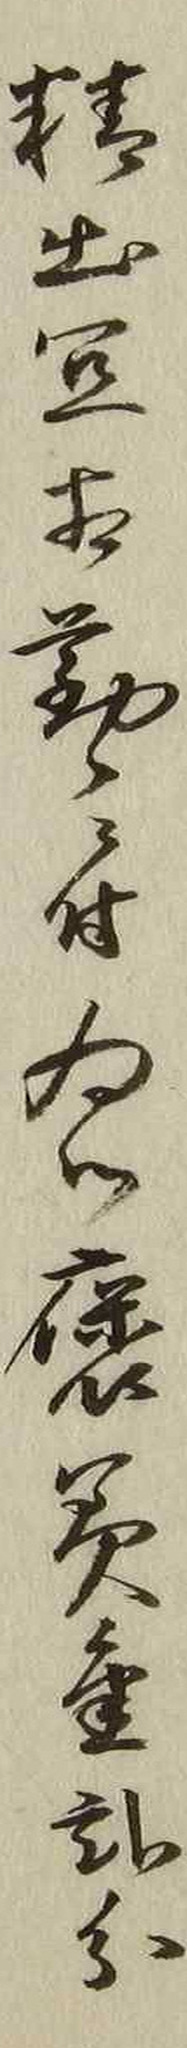精出宜相勤候ニ付為御褒美金弐分
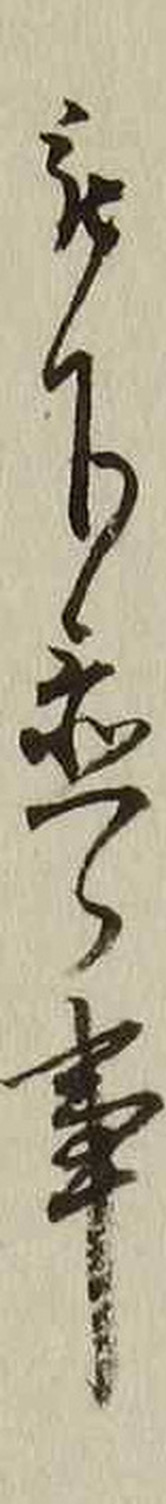被下置候事
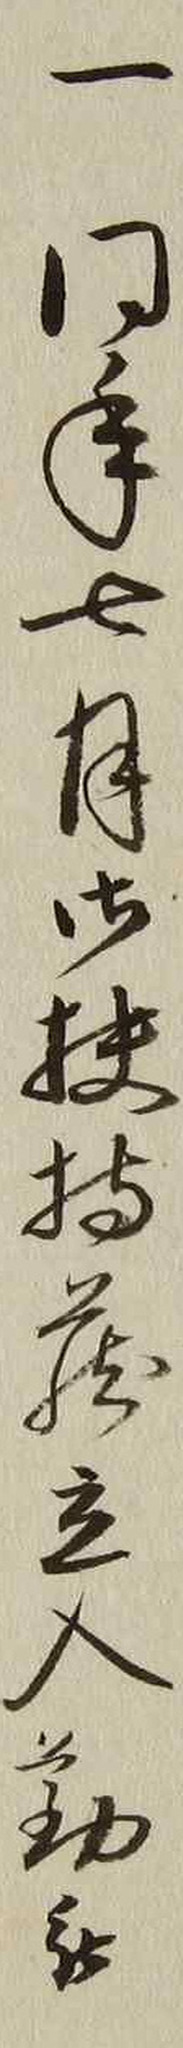一同年七月御扶持蔵立入勤被
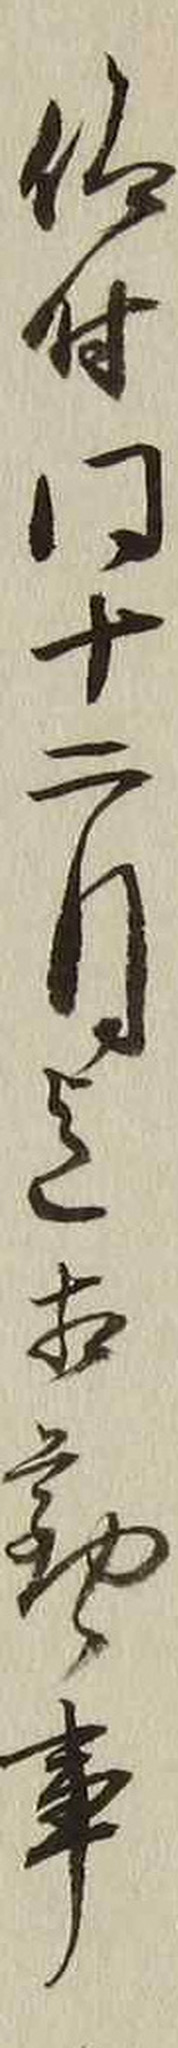仰付同十二月迄相勤候事
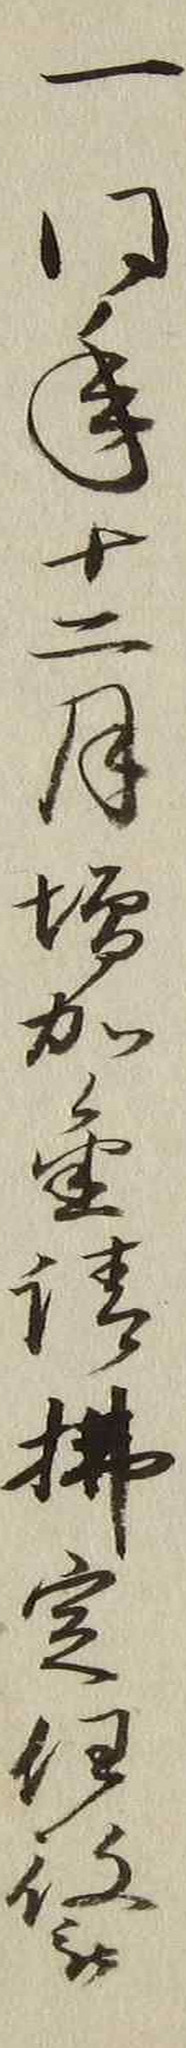一同年十二月増加金請払定任役被
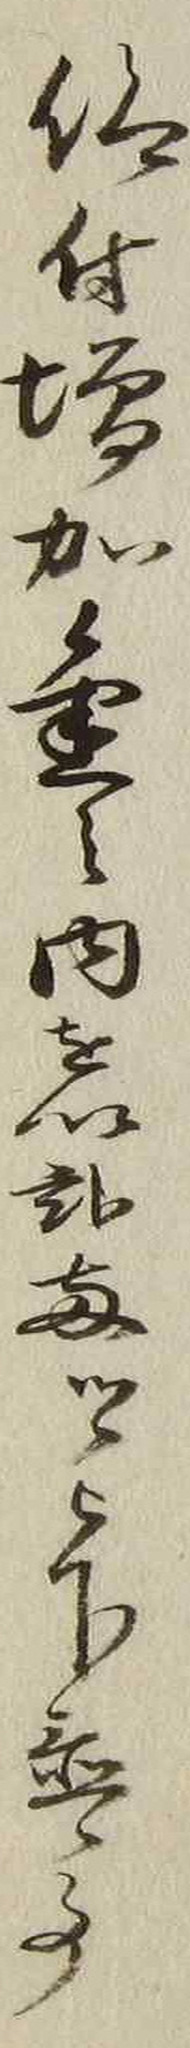仰付増加金之内を以弐両ツヽ被下置候事
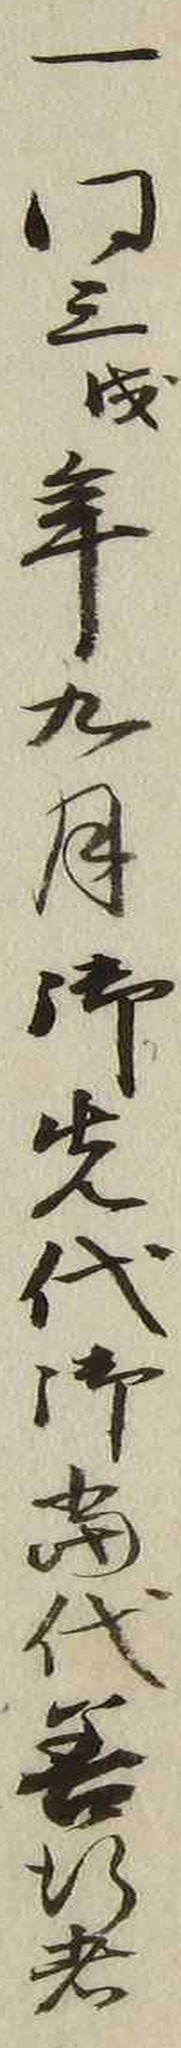一同三戌年九月御先代御当代善行者
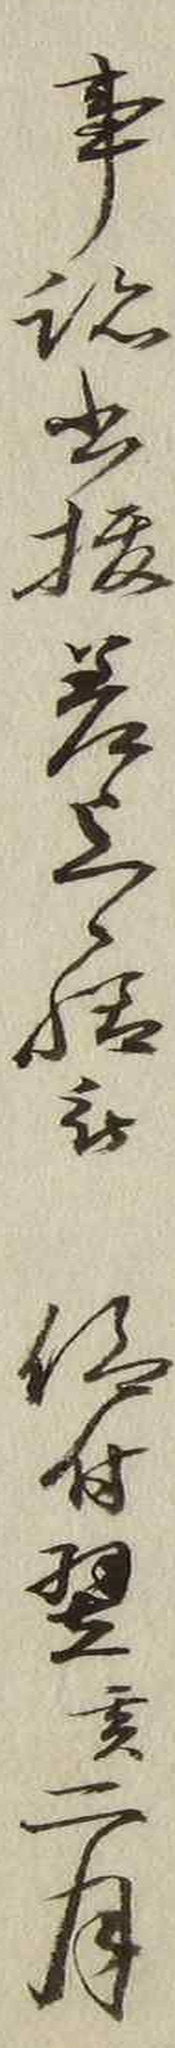事跡書抜差上候様被仰付翌亥二月
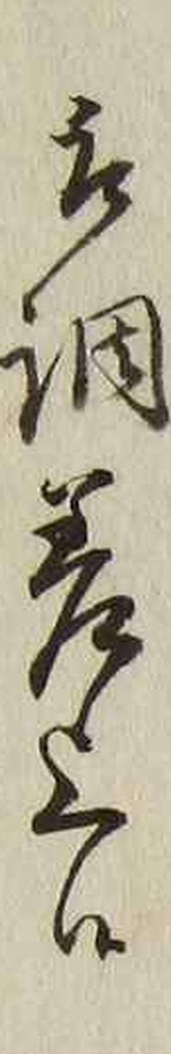取調差上候
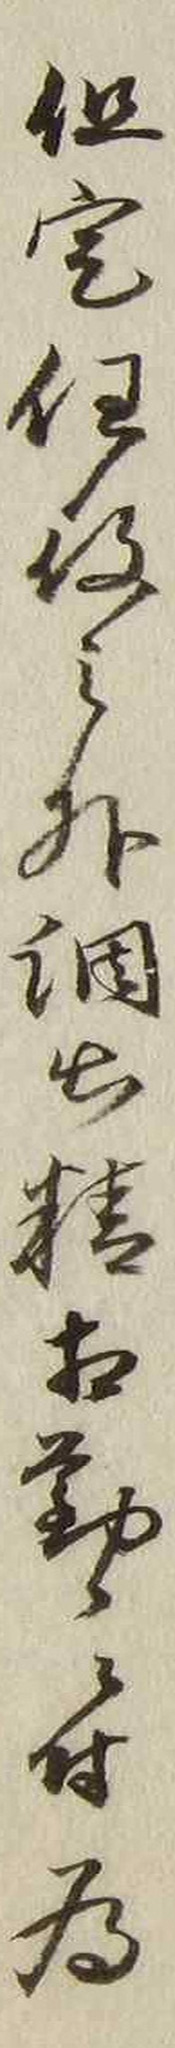但定任役之外調出精相勤候ニ付為
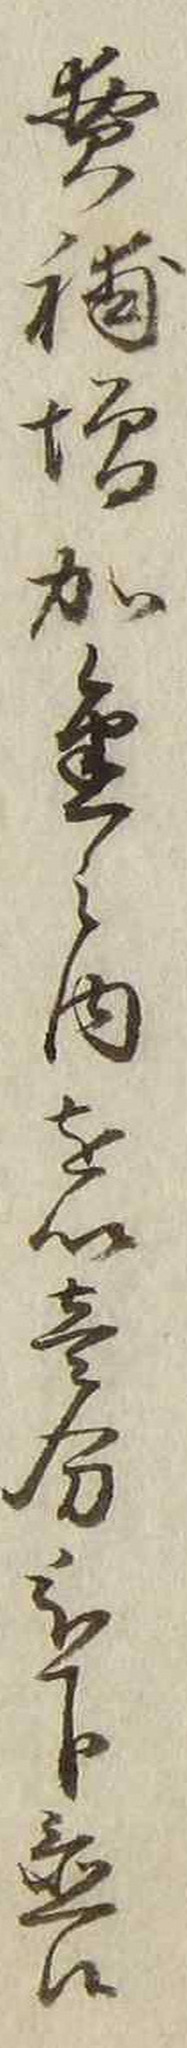費補増加金之内を以壱分被下置候

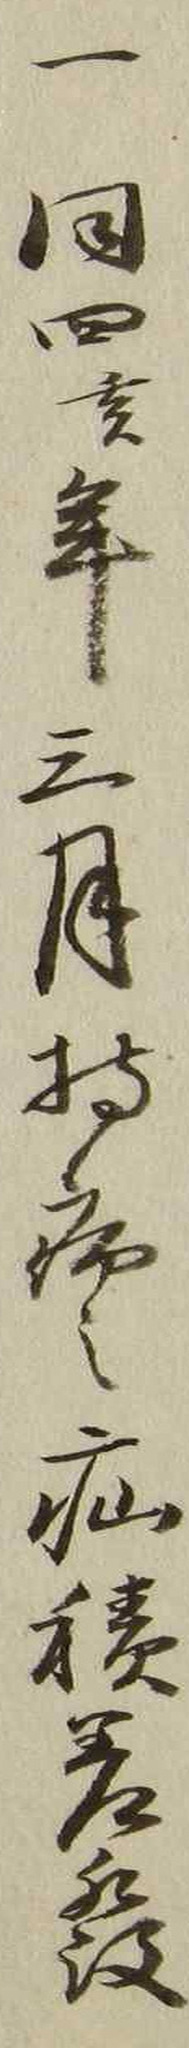一同四亥年三月持病之疝積差発
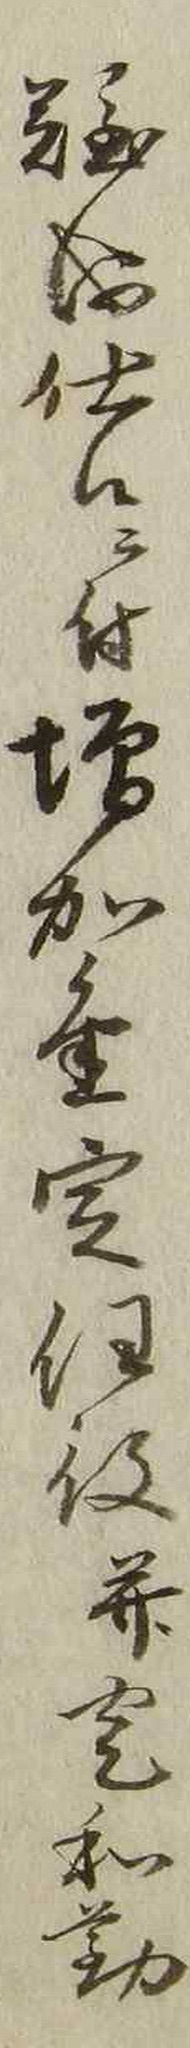難儀仕候ニ付増加金定任役并宅和勤
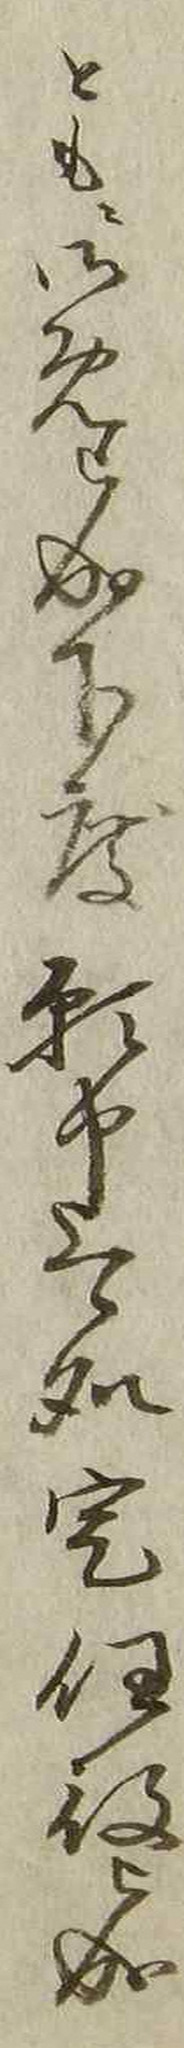ともニ御免被成下度願申上候処定任役被成
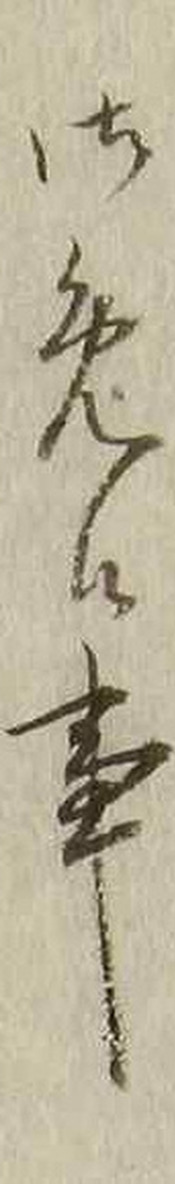御免候事
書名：諸士系譜　巻之102　か之部10
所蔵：会津若松市立会津図書館
